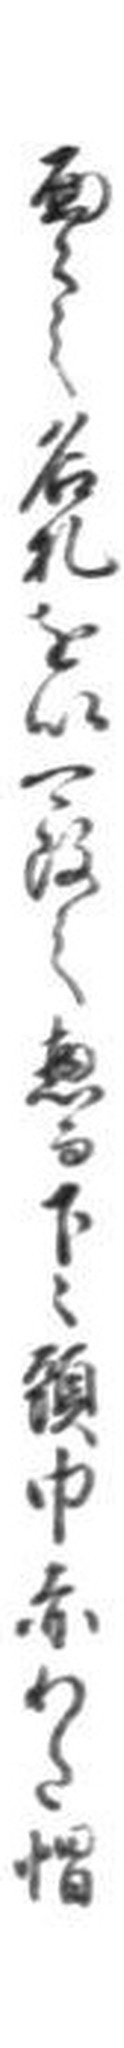面々之名札を以可改之惣而下々頭巾赤わた帽
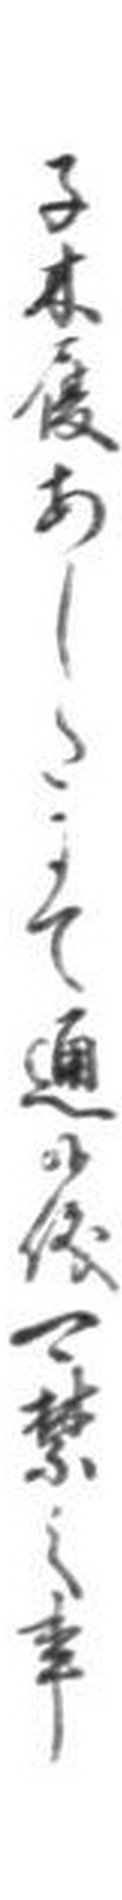子木履あしたにて通候儀可禁之事
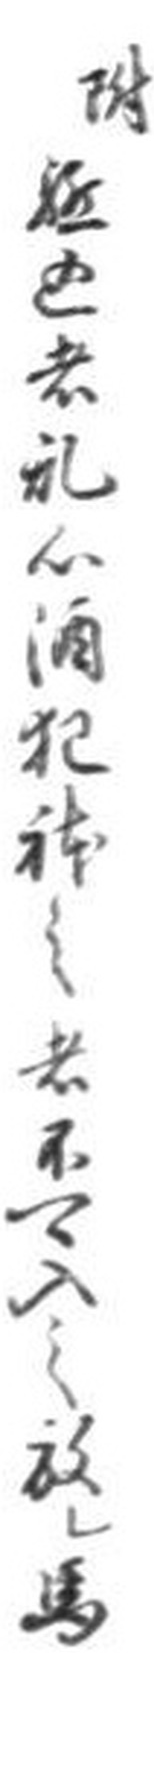駈込者乱心酒狂体之者不可入之放レ馬

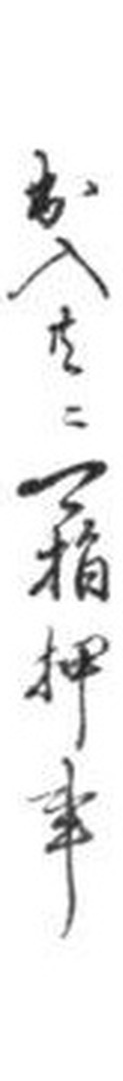出入共ニ可指押事
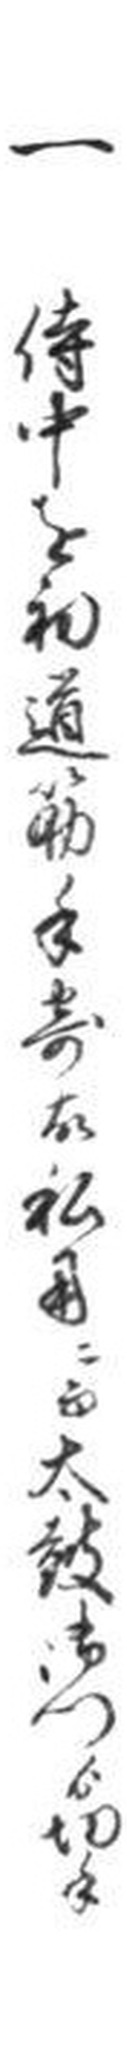一侍中を初道筋手寄故私用ニ而太鼓御門ゟ切手
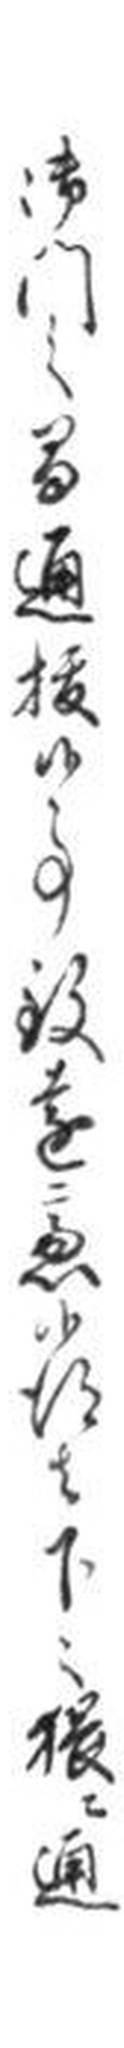御門之間通抜候事致遠慮候得者下々猥ニ通
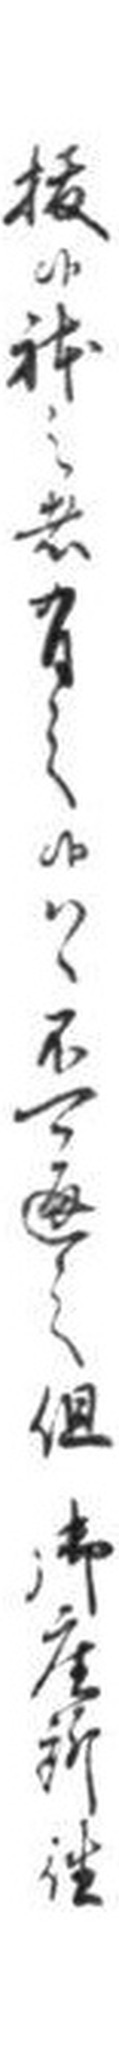抜候体之者有之候ハヽ不可通之但御座所往
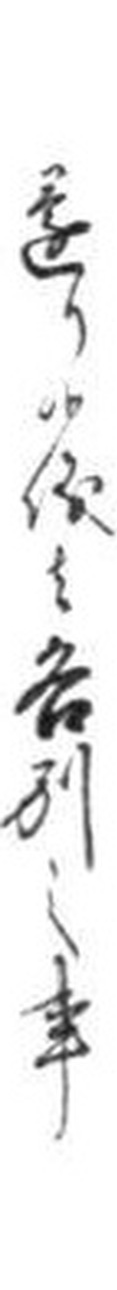還り候儀者各別之事
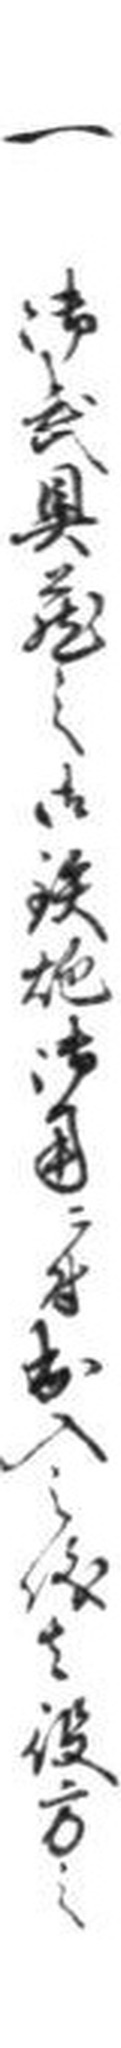一御武具蔵之御鉄炮御用ニ付出入之儀者役方之
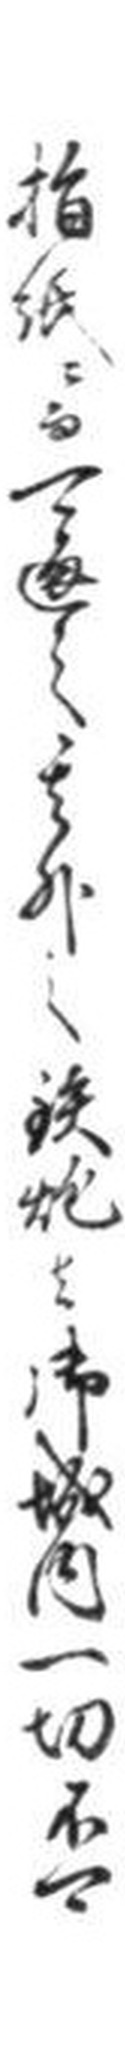指紙ニ而可通之其外之鉄炮者御城内一切不可
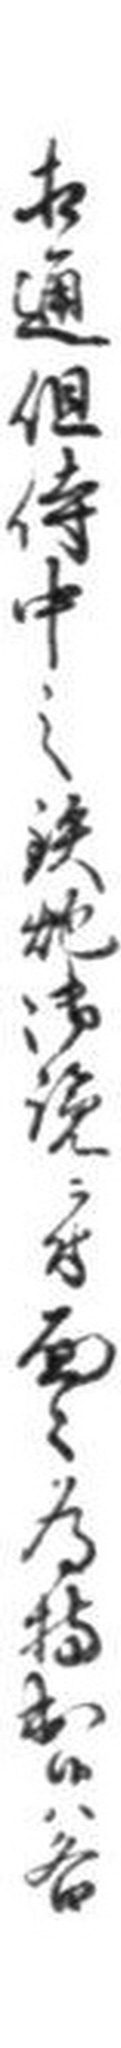相通但侍中之鉄炮御覧ニ付面々為持出候ハ各
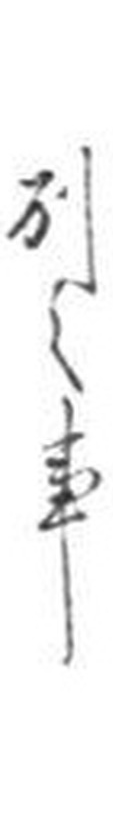別之事
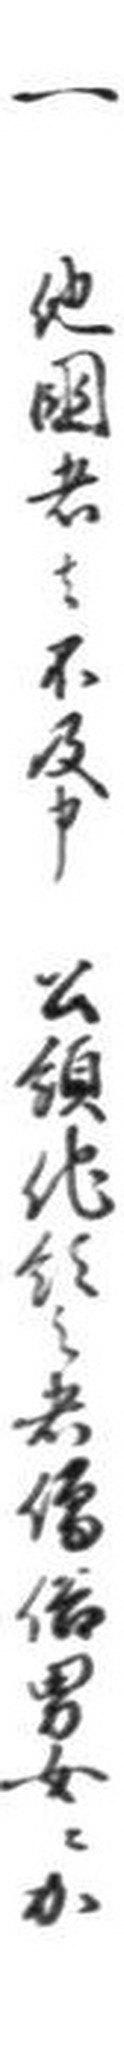一他国者者不及申公領他領之者僧俗男女ニか
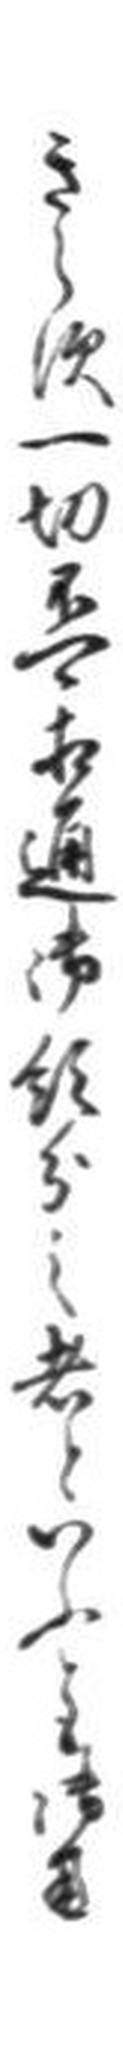きらす一切不可相通御領分之者といふとも御用
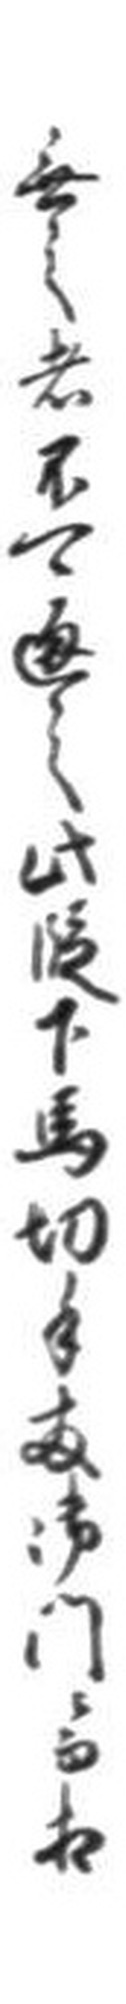無之者不可通之此段下馬切手両御門ニ而相
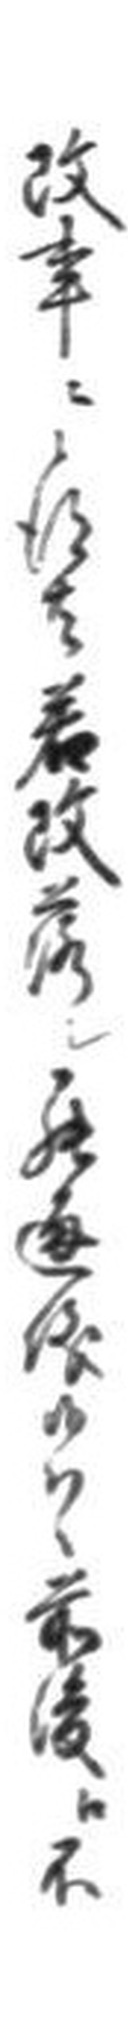改事ニ候得共若改落シ罷通儀候ハヽ前後江不
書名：家譜 三十三 吉邦公 享保四年
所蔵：福井県文書館 Fukui Prefectural Archives
